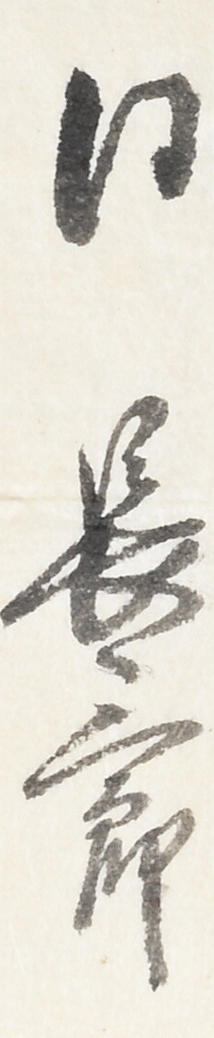同長三郎
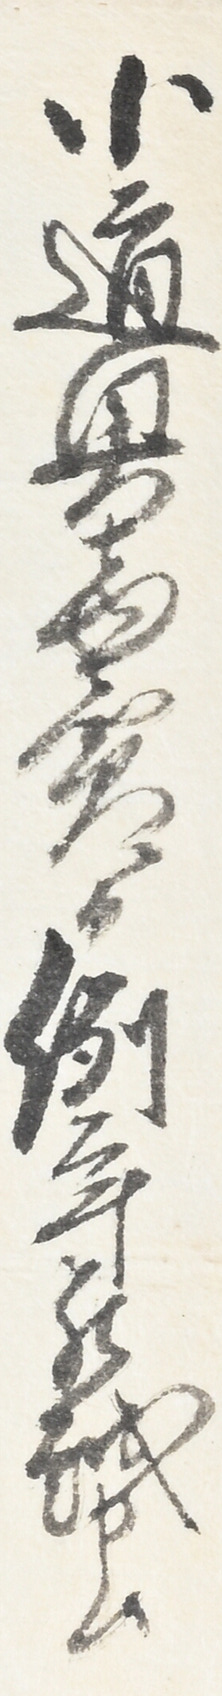小道具商売ニ而例年罷越申候
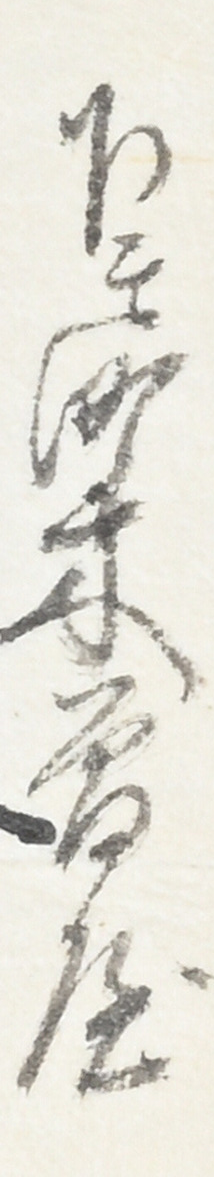下モ町木曽屋
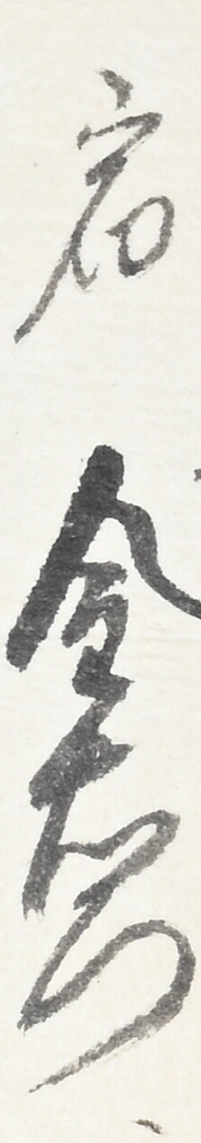宿金右衛門
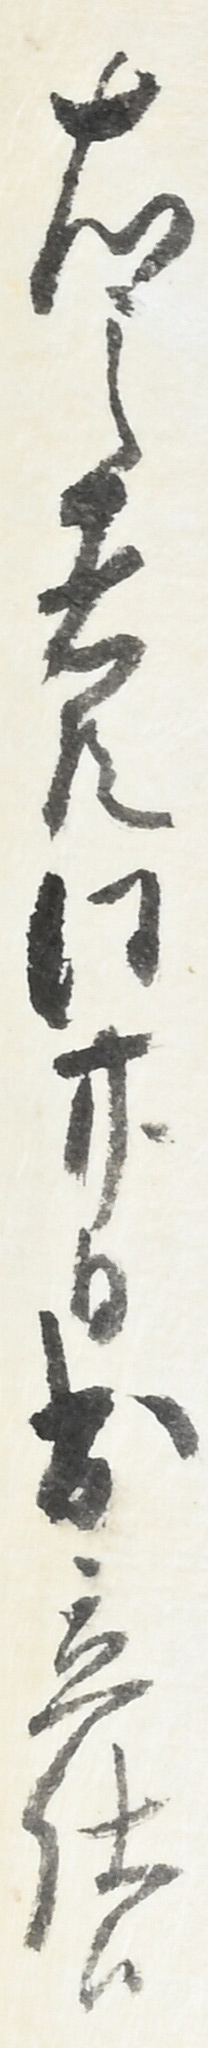右之者共同廿日出立仕候
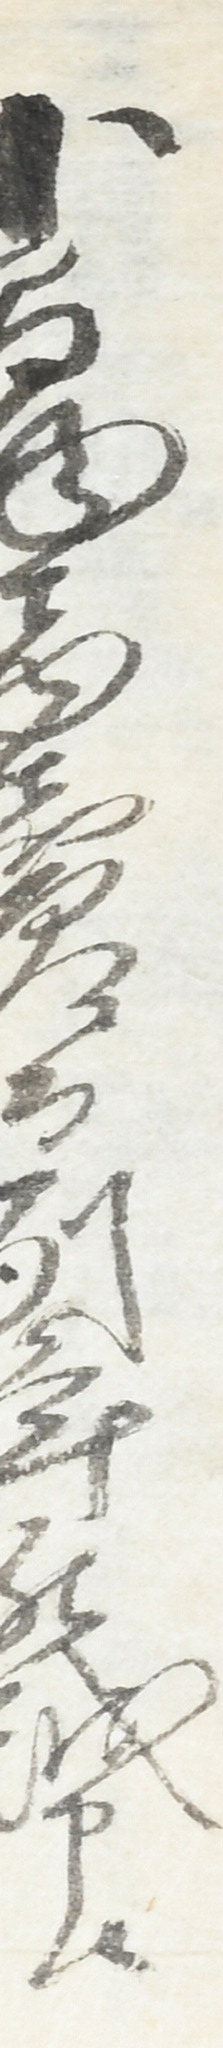小道具商売ニ而例年罷越申候

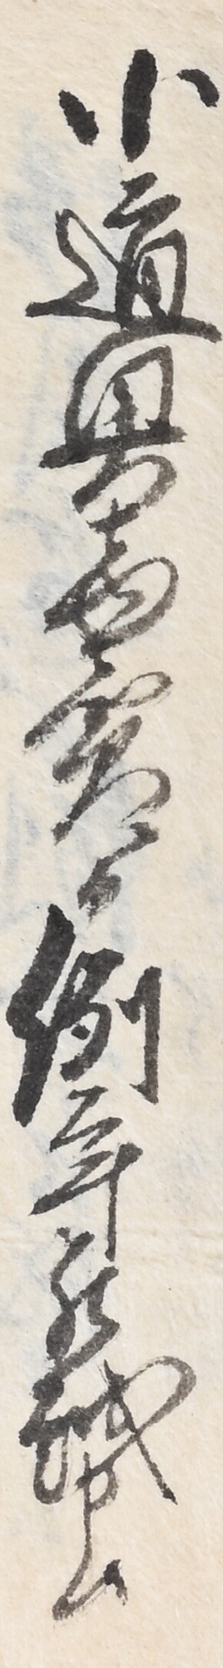小間物商売ニ而例年罷越申候
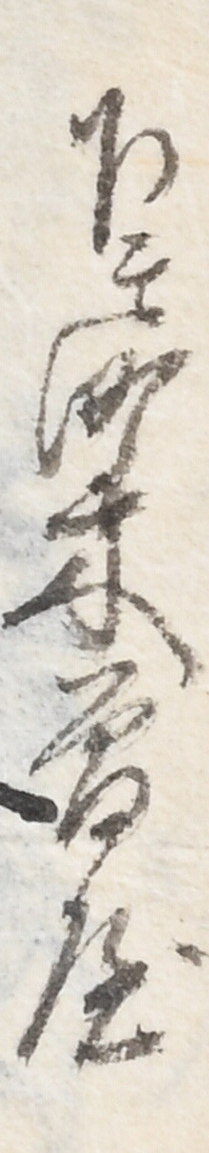下モ町木曽屋
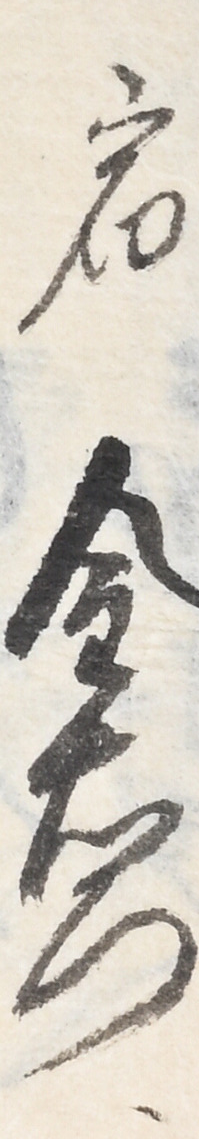宿金右衛門
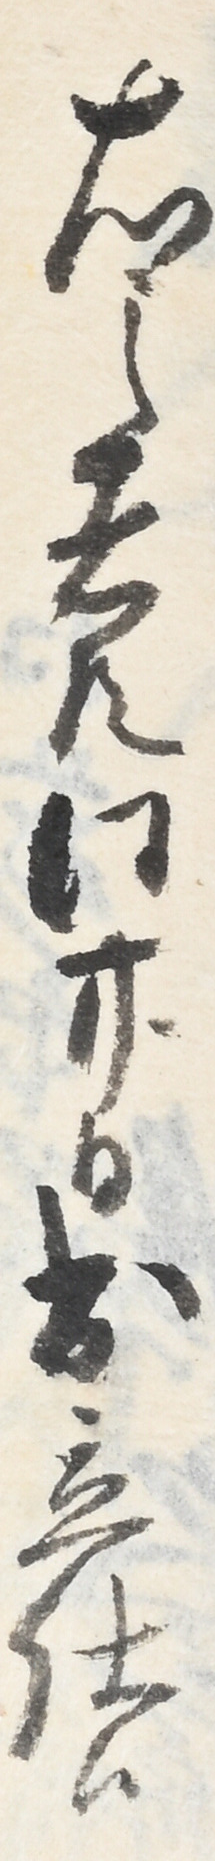右之者同廿二日出立仕候
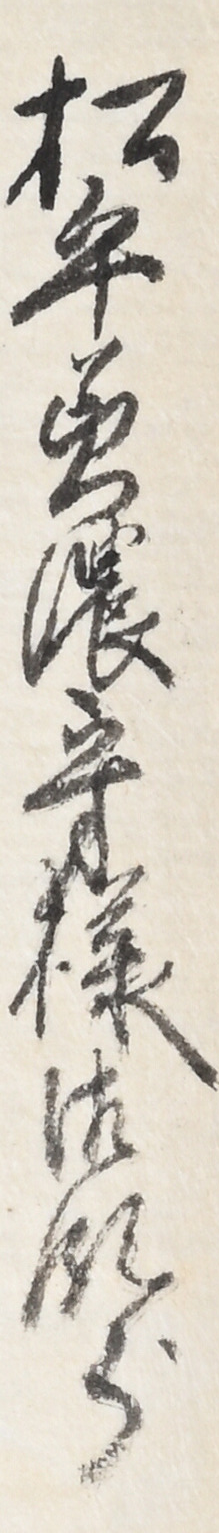松平美濃守様御領分
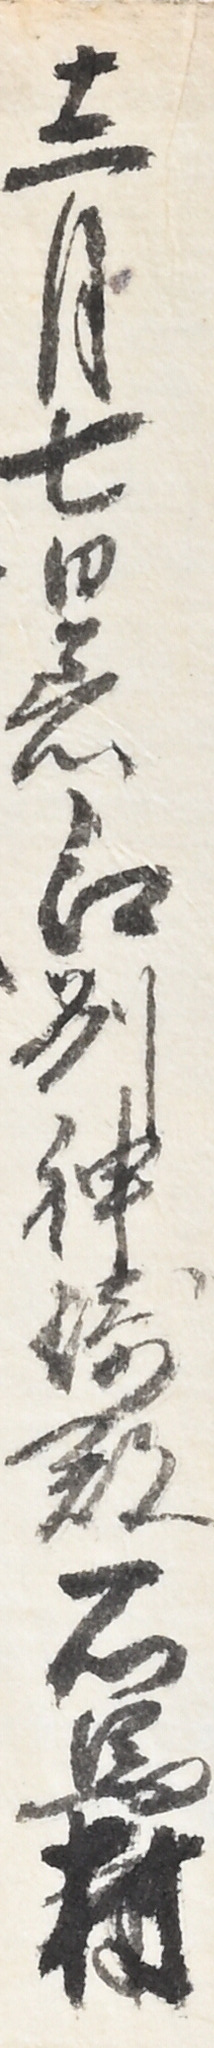十二月七日着江州神崎郡石馬村
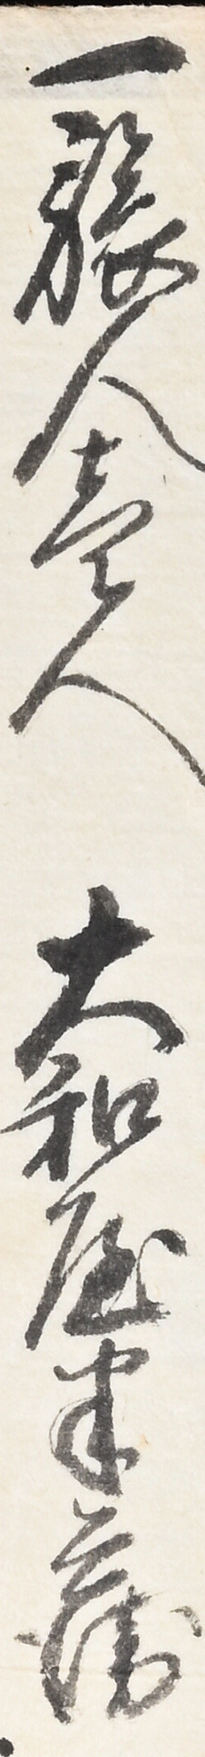一旅人壱人大和屋半兵衛
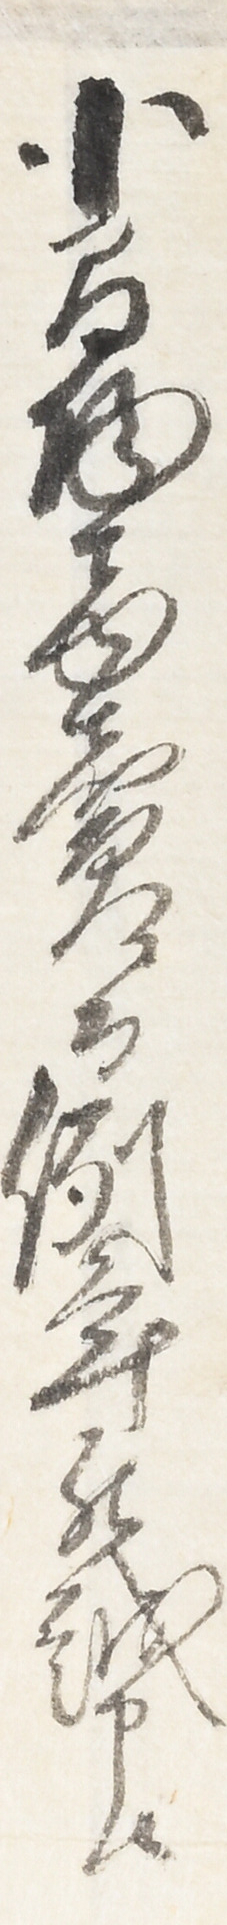小間物商売ニ而例年罷越申候
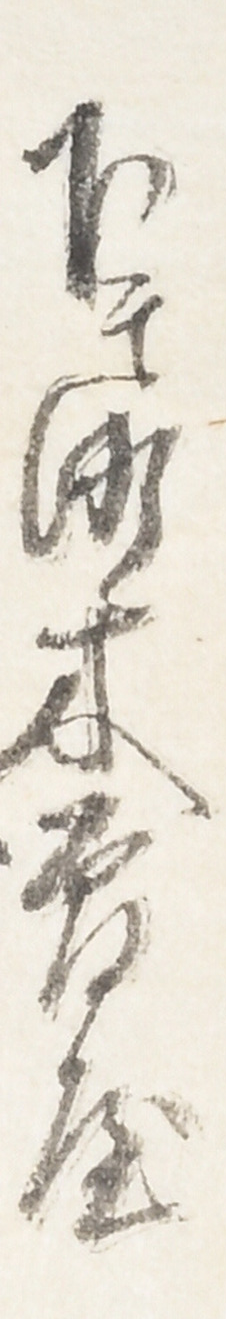下モ町木曽屋
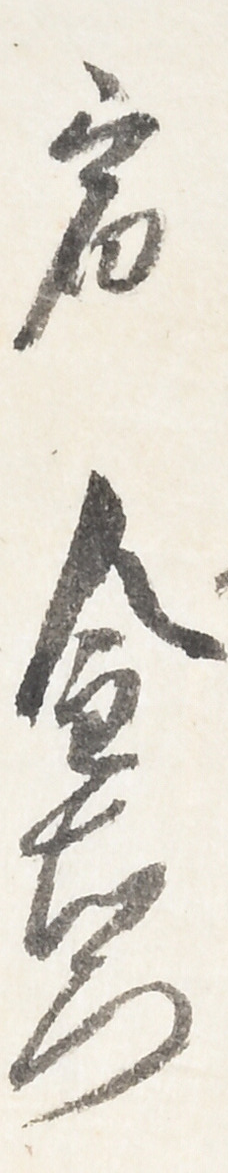宿金右衛門
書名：旅人泊控帳
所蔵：伊那市立高遠町図書館・合同会社AMANE
